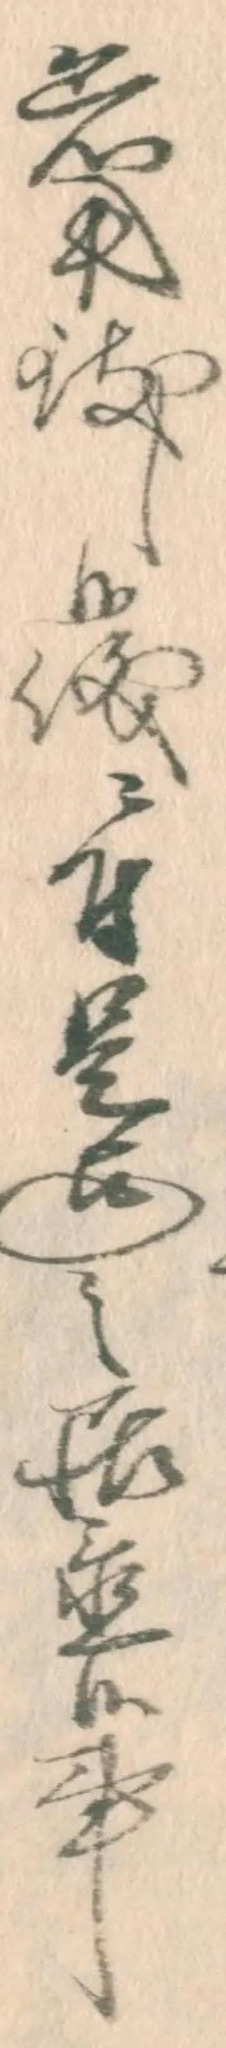着用致し候儀ニ付是迄之居置候事
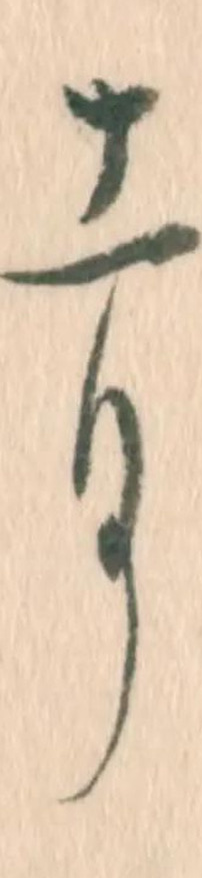十一月

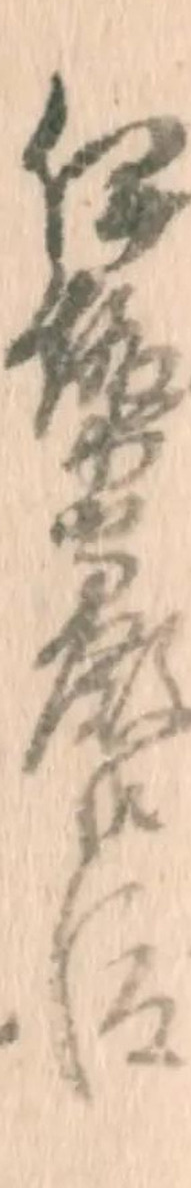伊勢守殿御渡
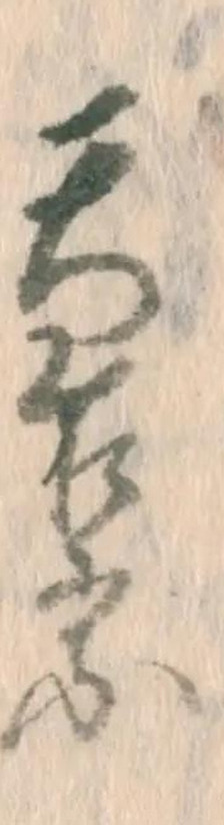天台宗
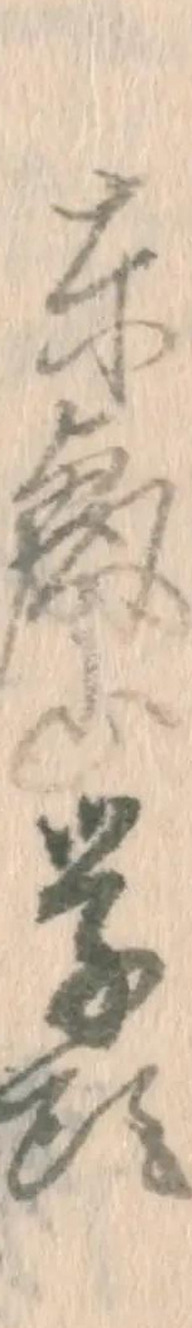東叡山学頭
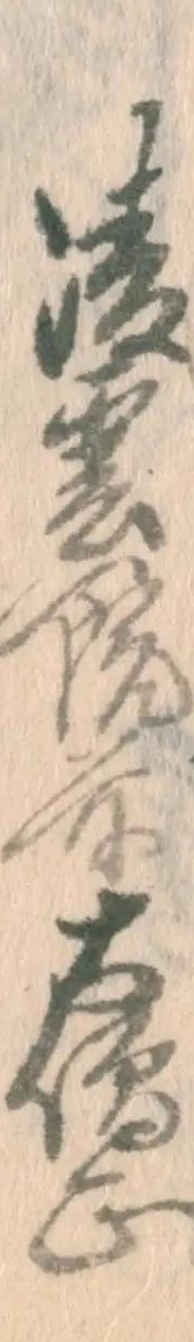凌雲院前大僧正
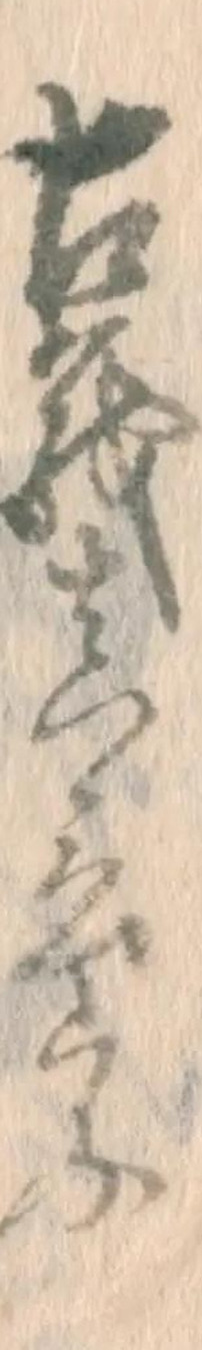古義真言宗
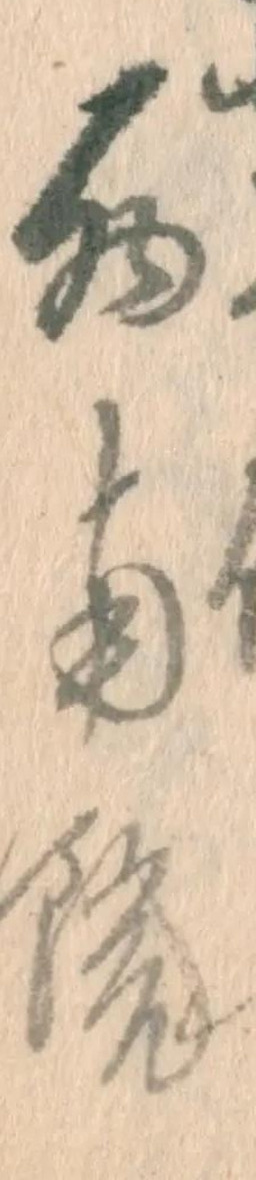西南院

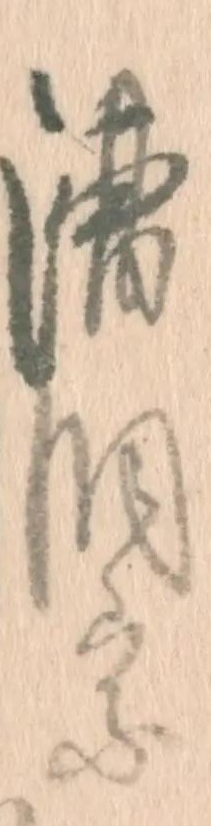漕洞宗
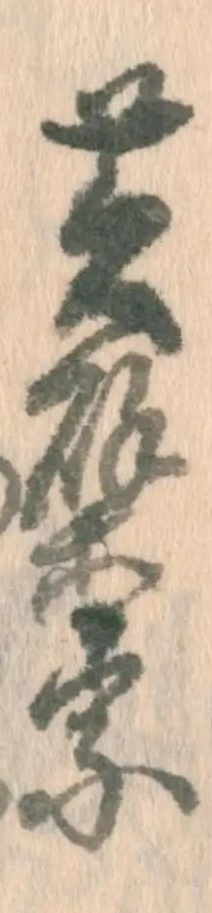黄檗宗
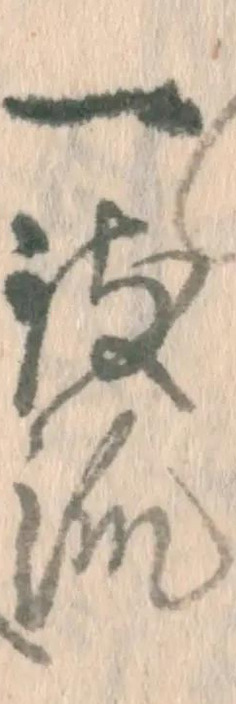一致派
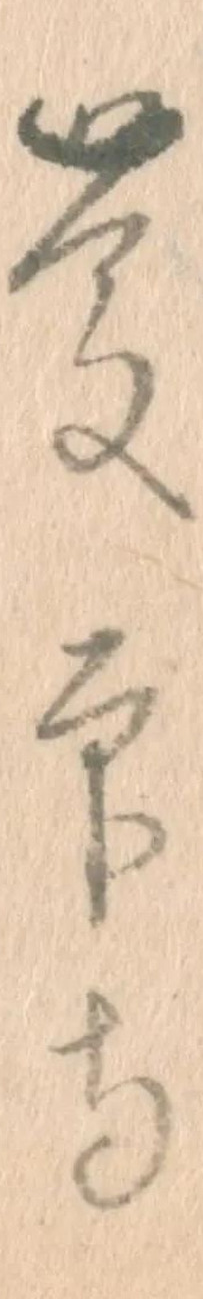慶印寺

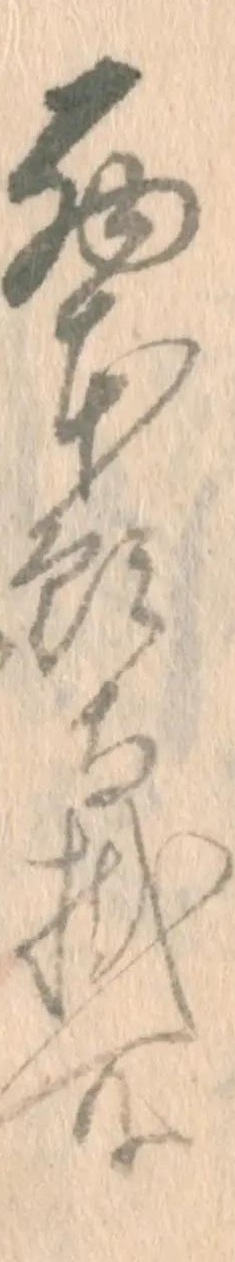西本願寺掛所
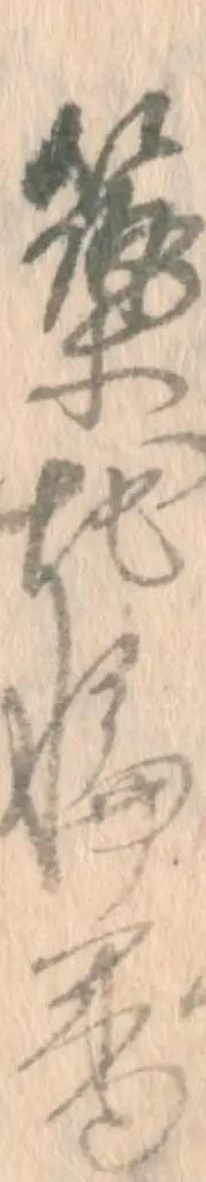築地輪番
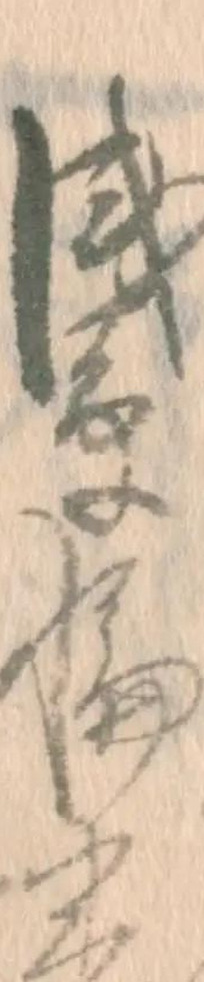浅草輪番
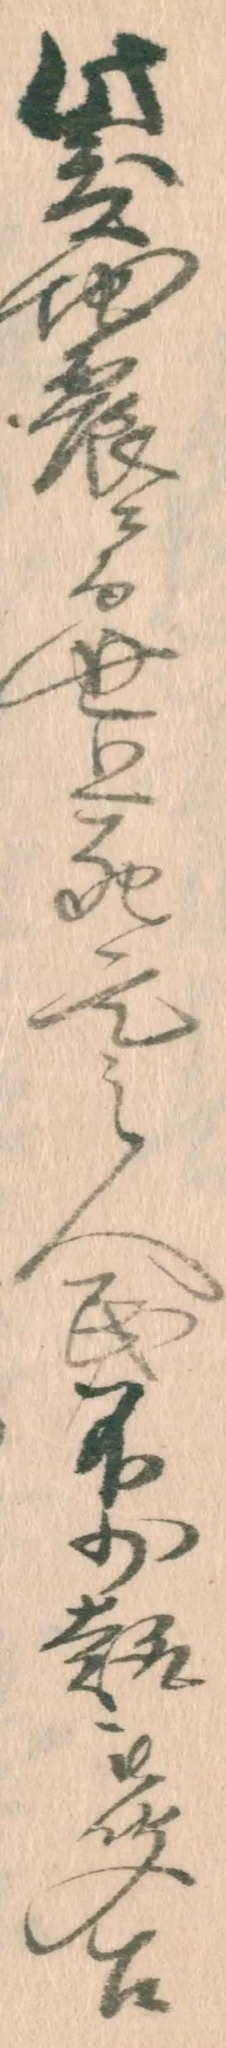此度地震ニ而世上死亡之人民不少趣被聞召
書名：地震災書留 2巻. [1] 内表紙に「地震災書留　安政二卯年　但本所深川御用屋敷地代免除調」とあり
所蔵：国立国会図書館 National Diet Library, JAPAN
